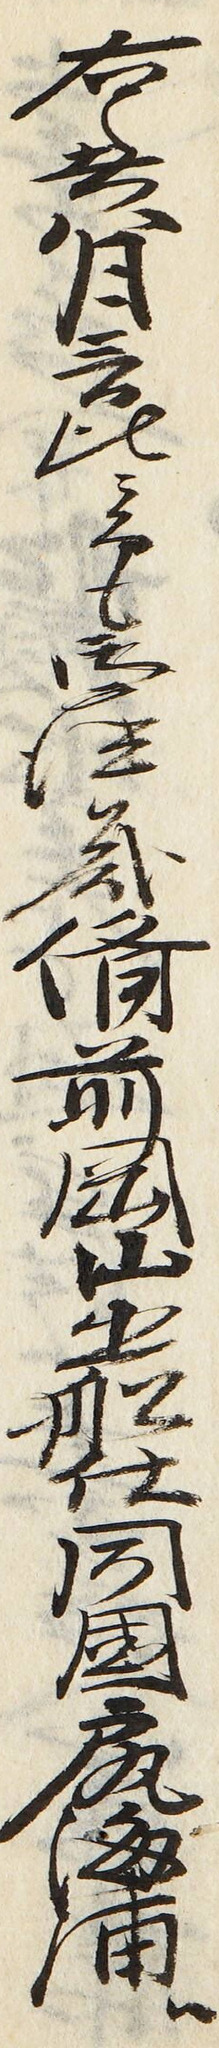右之者八月三日頃にても御座候哉備前岡山出船仕同国尻海浦え
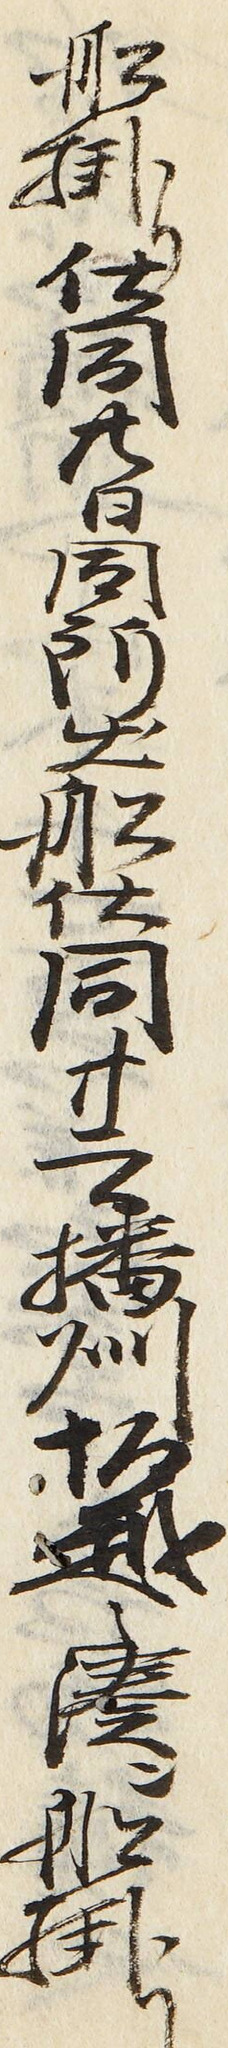船掛り仕同廿日同所出船仕同廿二日播州坂越之湊に船掛り
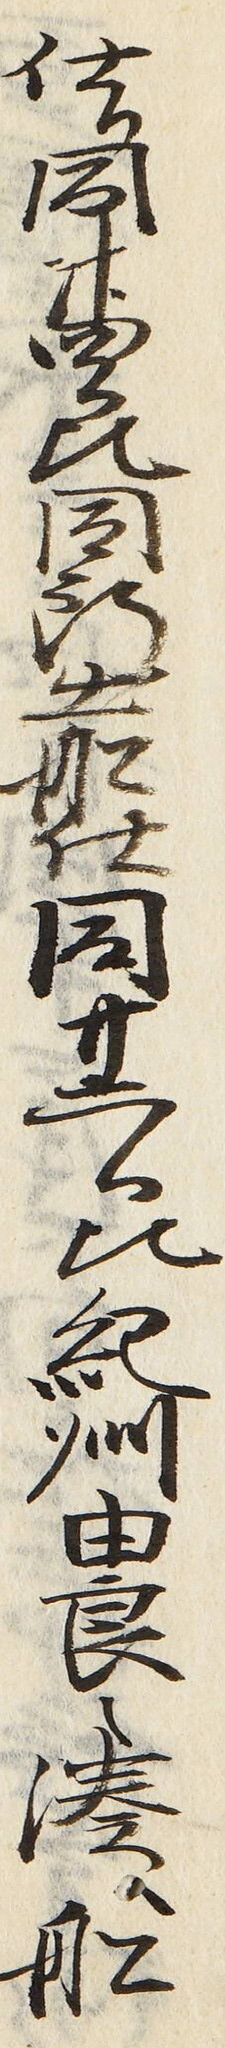仕り同廿四日頃同所出船仕同廿六日頃紀州由良之湊え船
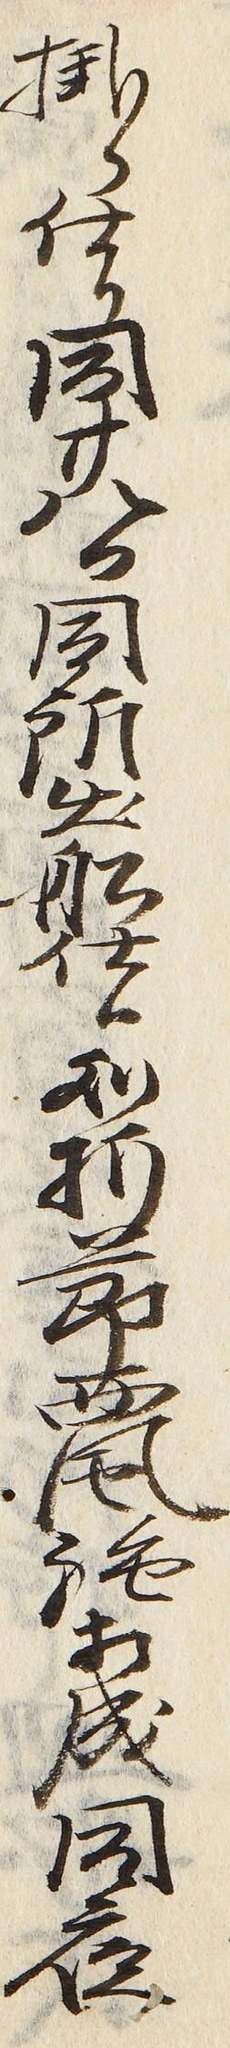掛り仕り同廿八日同所出船仕候処折節西風強相成同夜
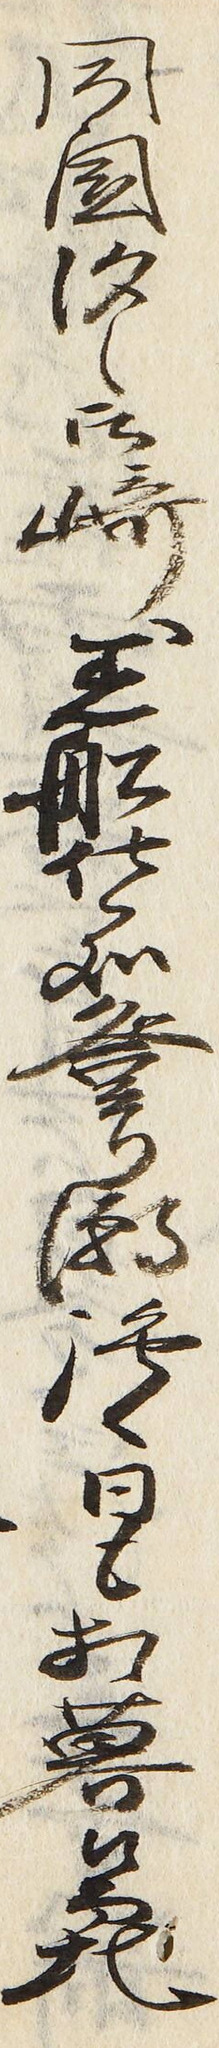同国汐之御崎へ着船仕候処登り潮強く日も相暮れ候て北
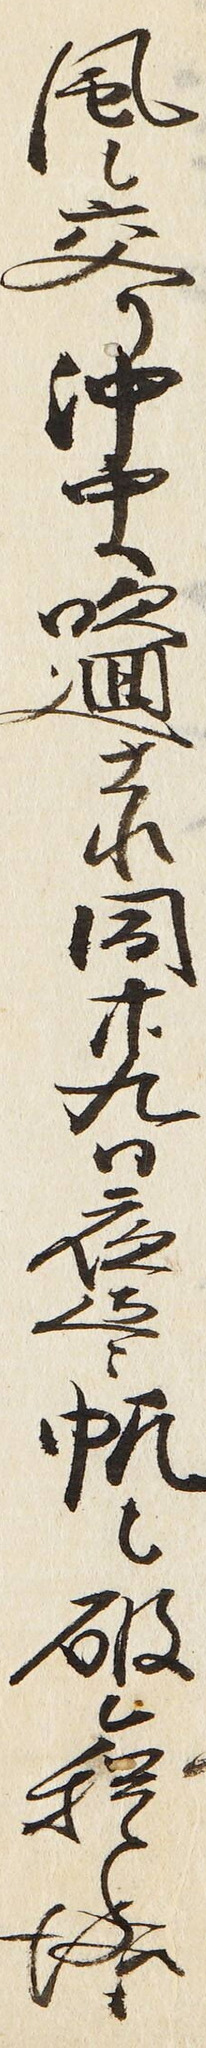風も交り沖中へ吹廻され同廿九日夜迄に帆も破候程之儀も
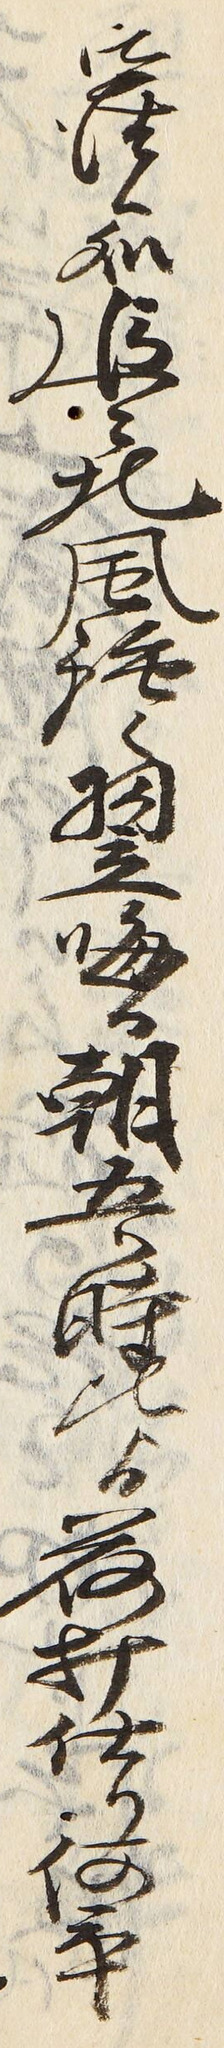御座候処追々北風強く翌晦日朝五つ時頃ゟ荷打仕り何卒
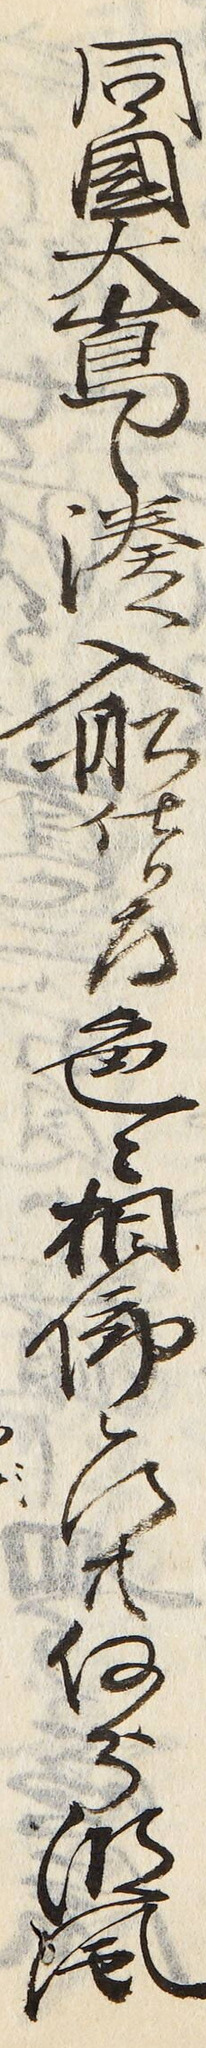同国大嶌之湊へ入船仕り度色々相働候得共何分波風
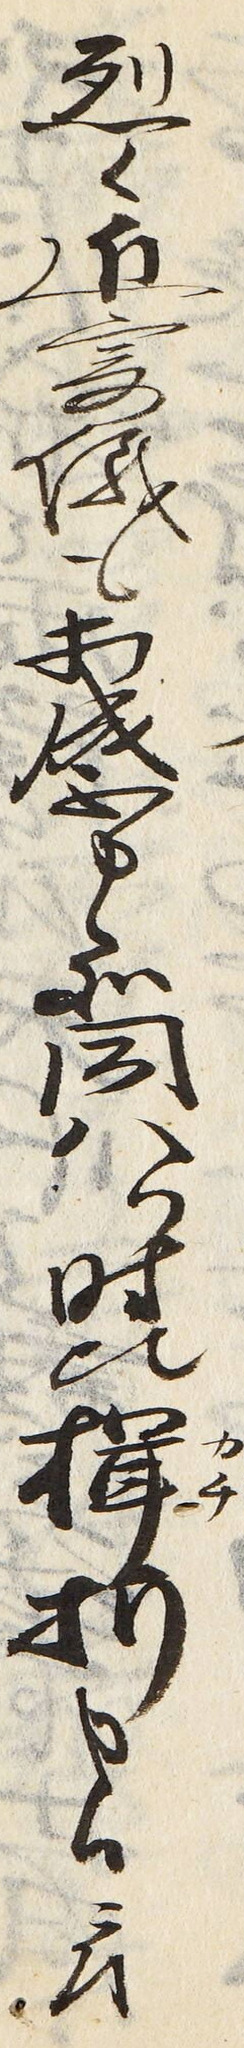烈く近寄儀も相成不申候処同八つ時頃梶折申候に付
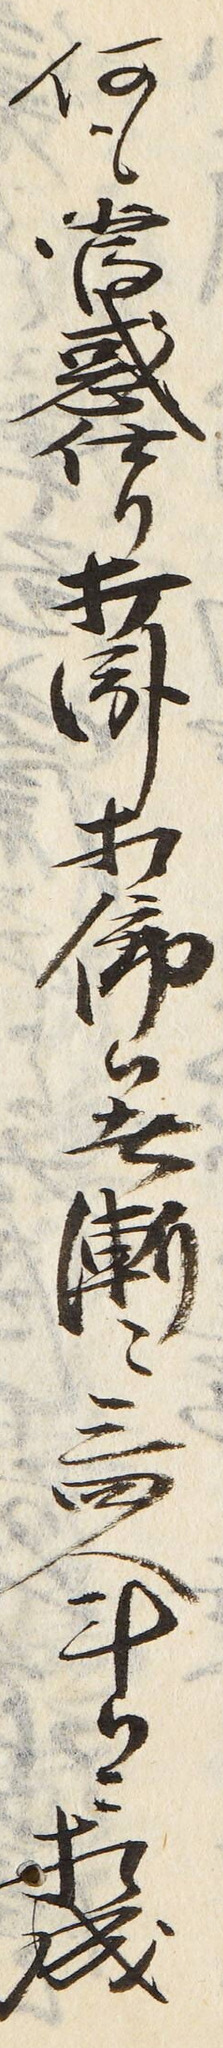何も当惑仕り打臥相働候者漸々三四人斗りに相成
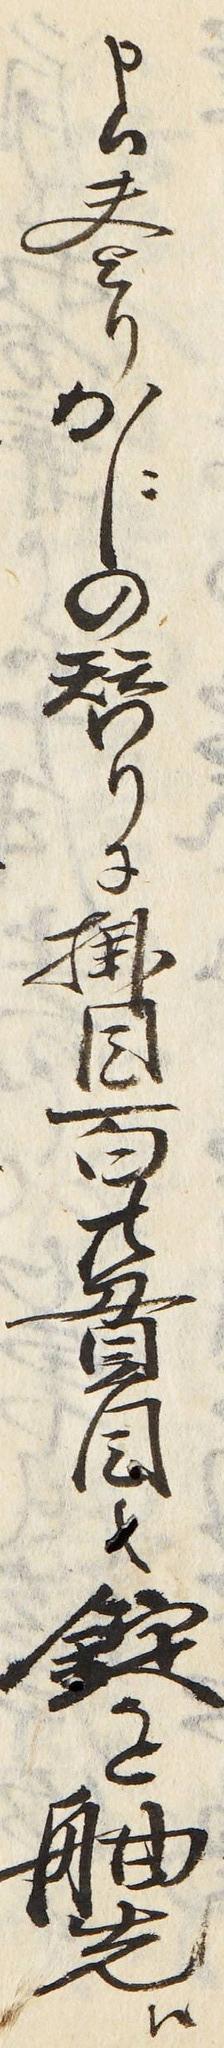申候夫よりかじの替りに掛目百廿貫目之錠を舳先え
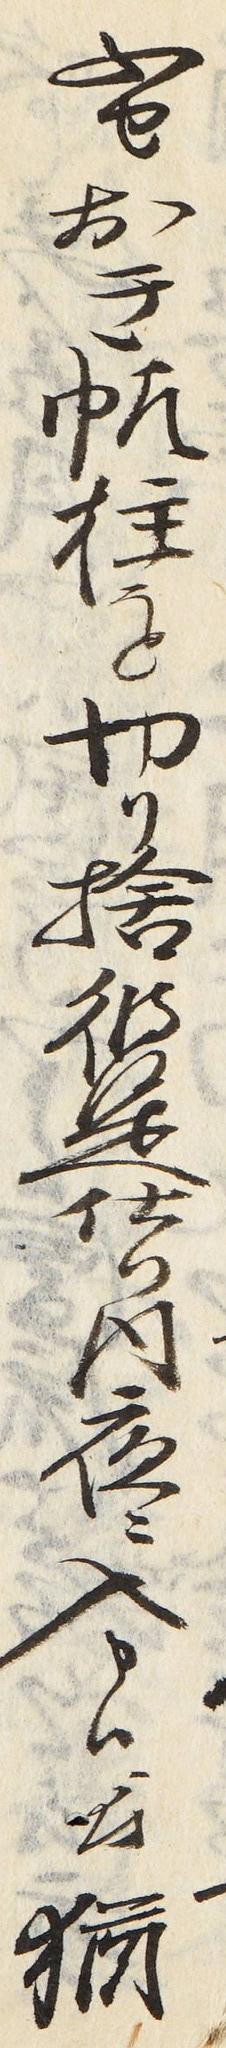ふせおき帆柱を切り捨彼是仕候内夜に入申候に付猶
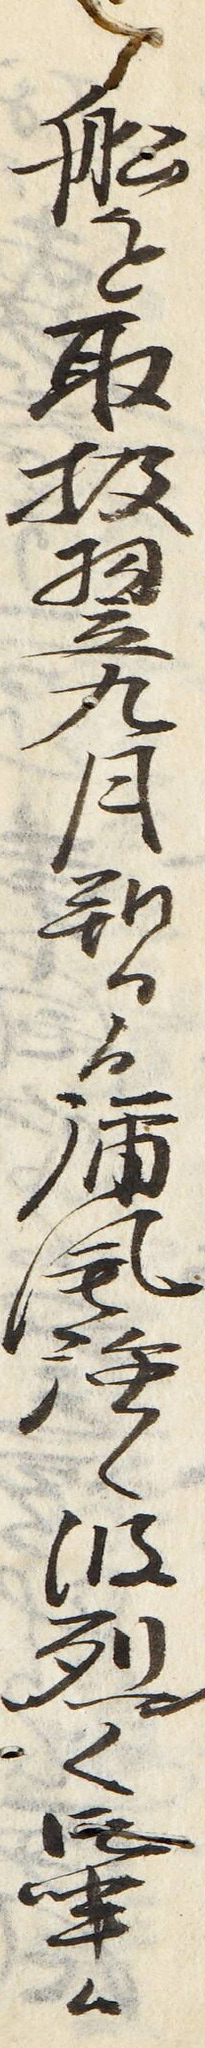船を取扱翌九月朔日より弥風強く波烈く御座候
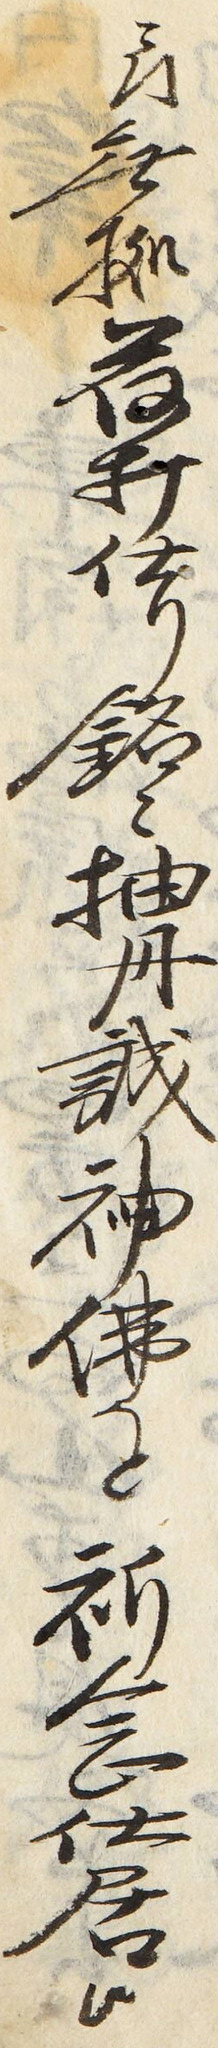に付無拠荷打仕り銘々抽丹誠神仏を祈念仕居候

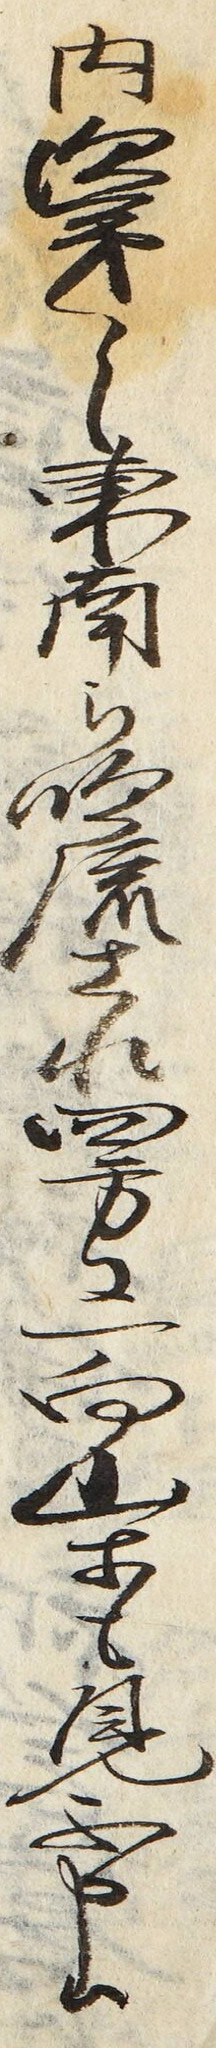内次第に東南え吹流され四方に一向山等も見不申候
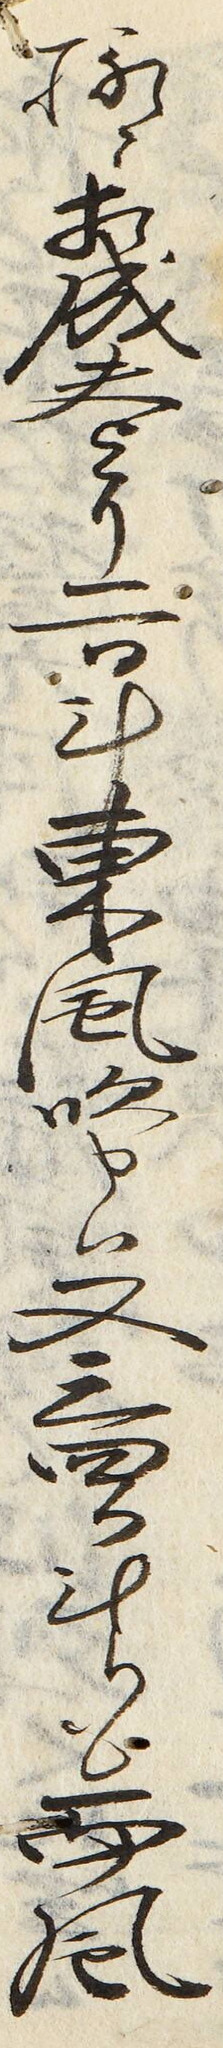様に相成夫より二日斗東風吹申候又三四日斗りも西風
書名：漂流記
